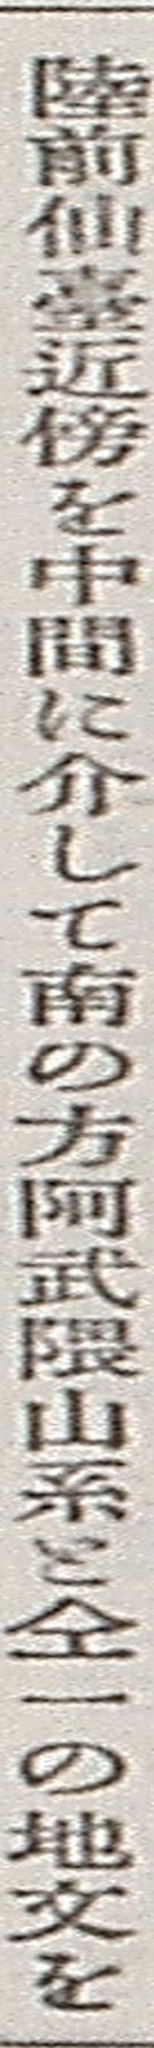陸前仙台近傍を中間に介して南の方阿武隈山系と同一の地文を
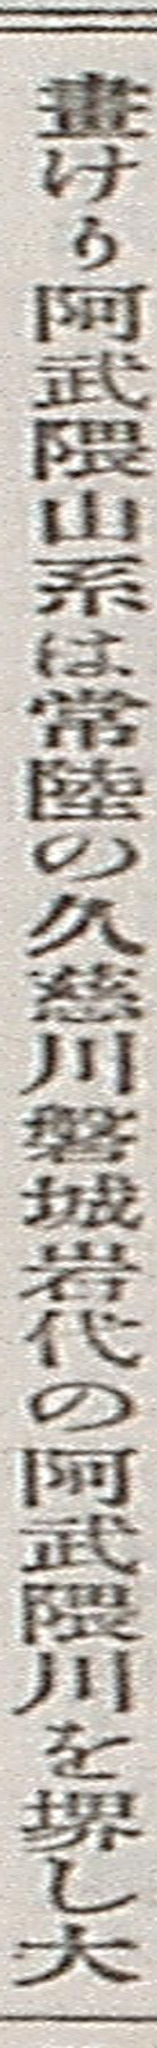画けり阿武隈山系は常陸の久慈川磐城岩代の阿武隈川を堺し大
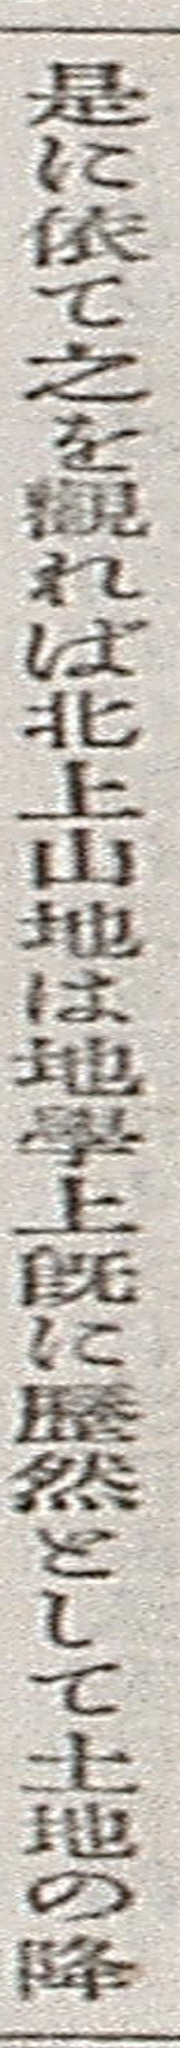是に依て之を観れば北上山地は地学上既に歴然として土地の降
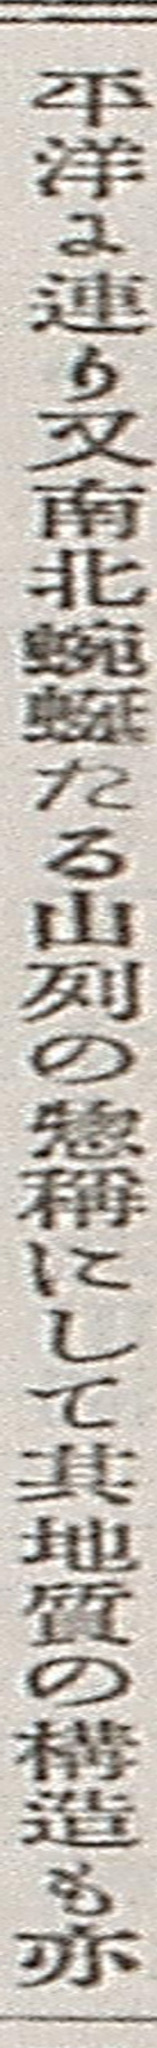平洋に連り又南北蜿蜒たる山列の惣称にして其地質の構造も亦
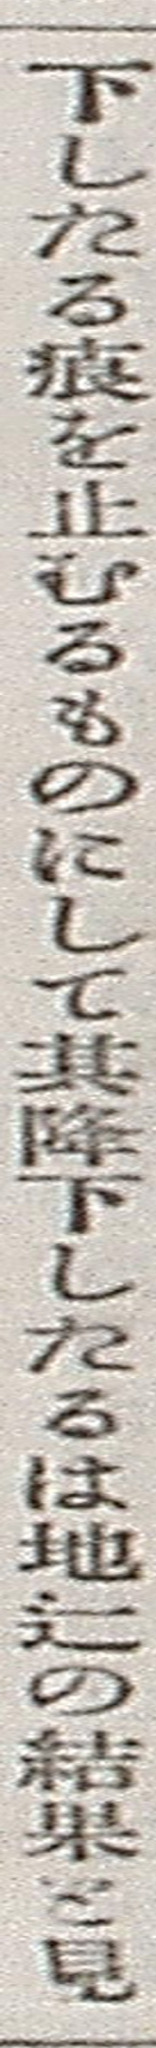下したる痕を止むるものにして其降下したるは地辷の結果と見
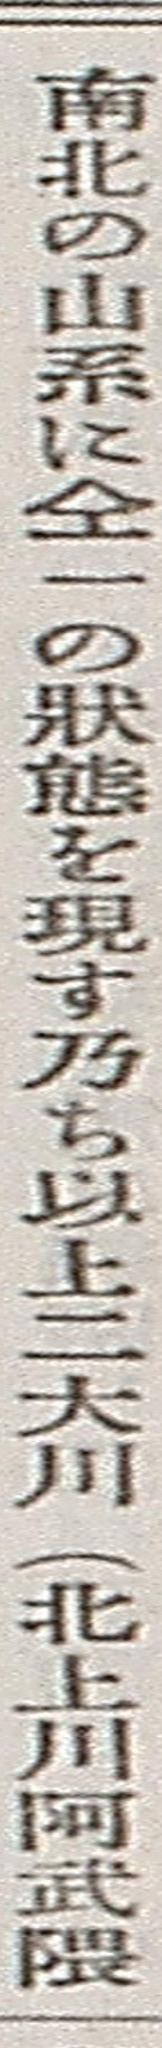南北の山系に同一の状態を現す乃ち以上二大川（北上川阿武隈
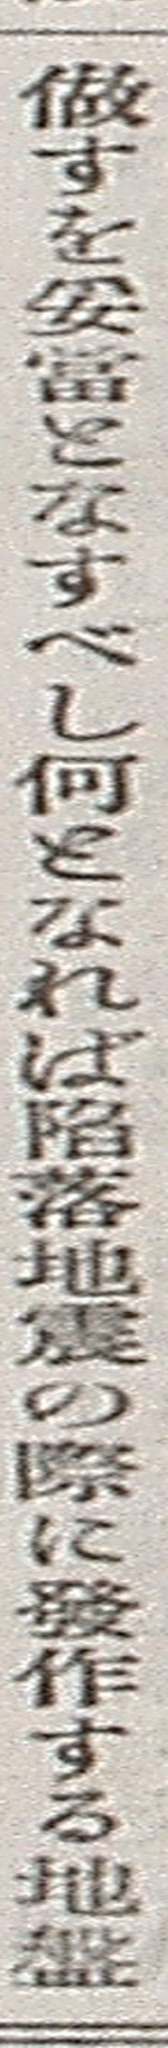做すを妥当となすべし何となれば陥落地震の際に発作する地盤
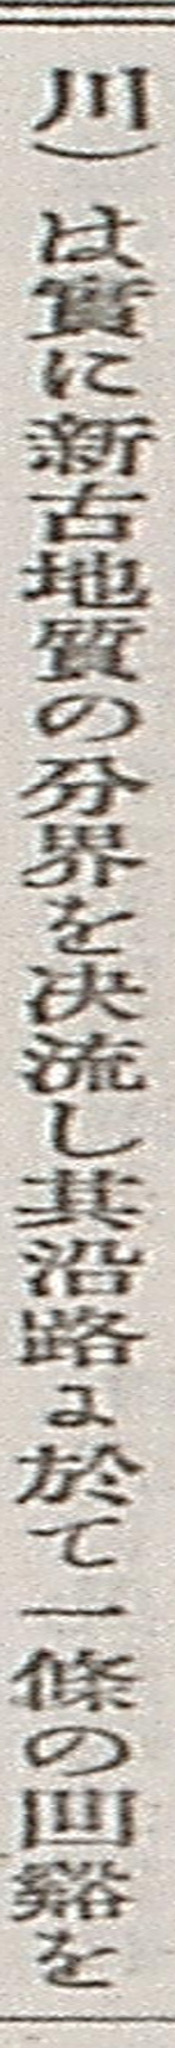川）は実に新古地質の分界を決流し其沿路に於て一条の凹谿を
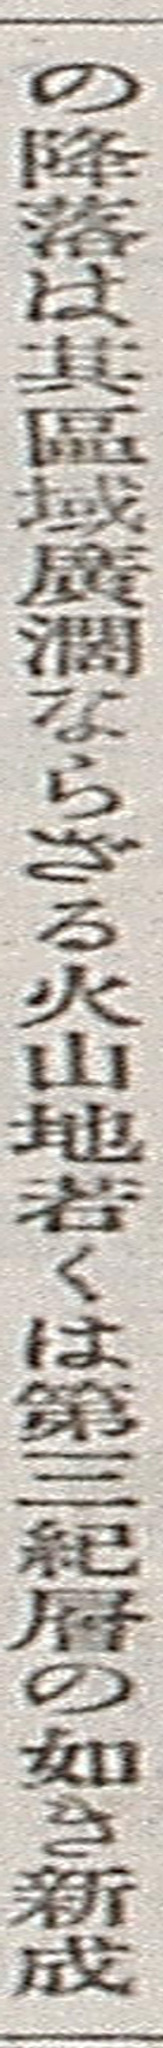の降落は其区域広潤ならざる火山地若くは第三紀層の如き新成
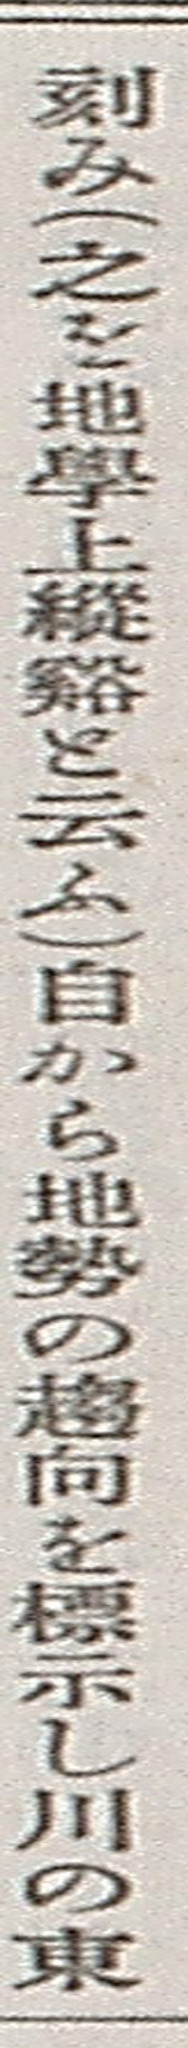刻み自から地勢の趨向を標示し川の東
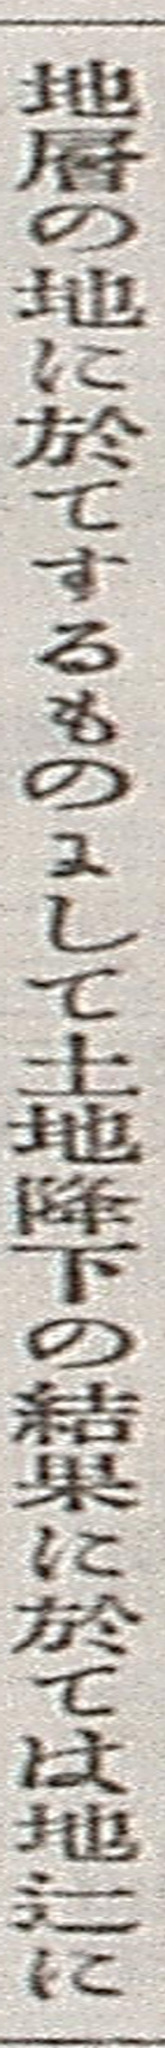地層の地に於てするものにして土地降下の結果に於ては地辷に
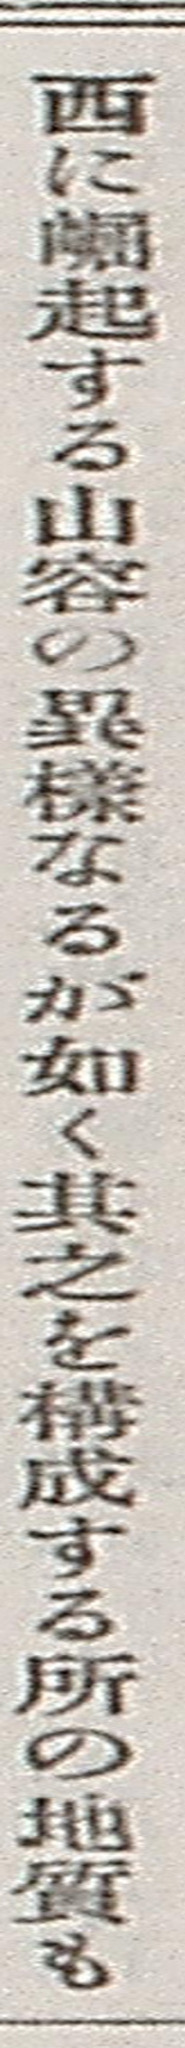西に崛起する山容の異様なるが如く其之を構成する所の地質も
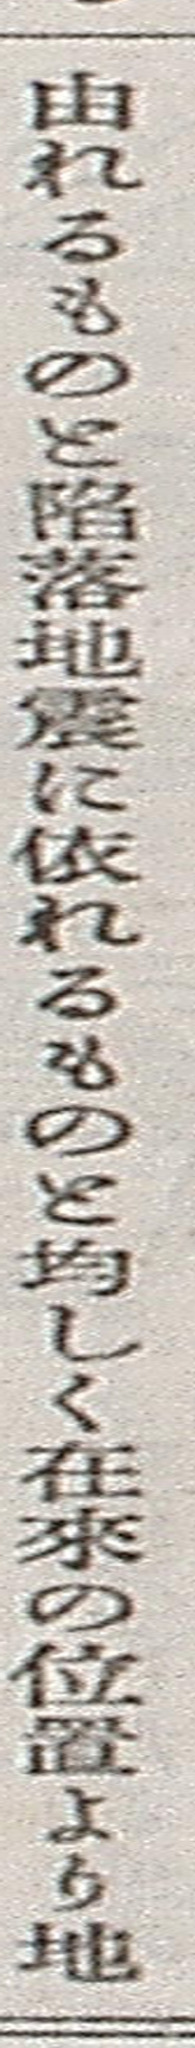由れるものと陥落地震に依れるものと均しく在来の位置より地
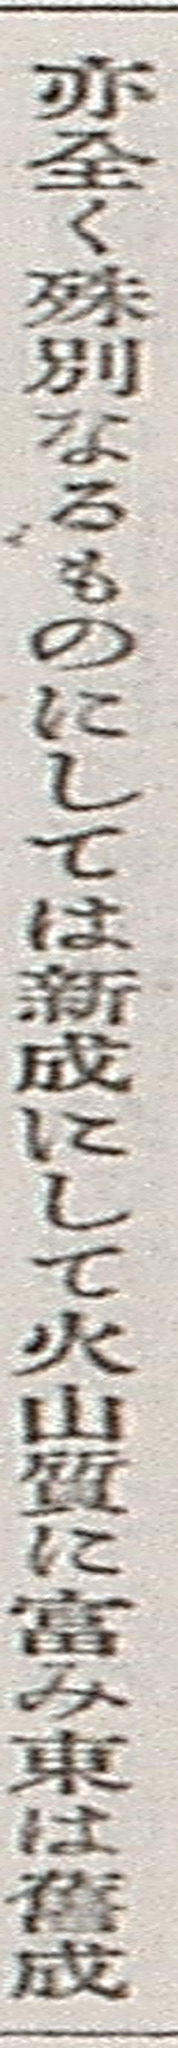亦全く殊別なるものにしては新成にして火山質に富み東は旧成
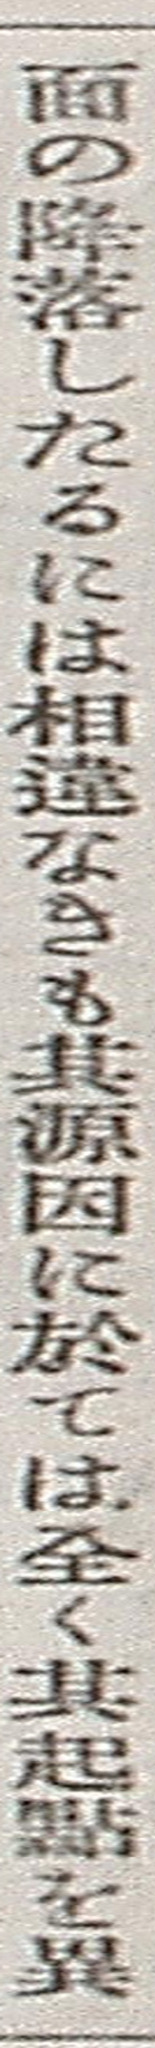面の降落したるには相違なきも其源因に於ては全く其起点を異
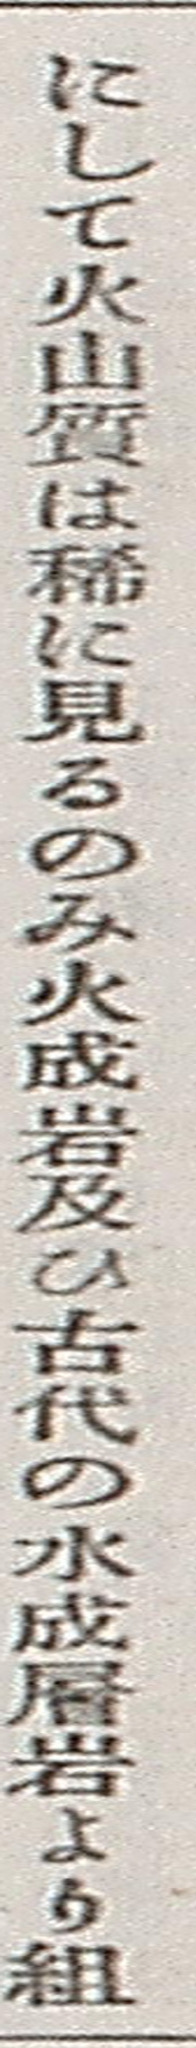にして火山質は稀に見るのみ火成岩及ひ古代の水成層岩より組
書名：風俗畫報臨時増刊第百二十號　大海嘯被害録（下）
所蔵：東京大学地震研究所図書室 Earthquake Research Institute Library, The University of Tokyo, JAPAN
